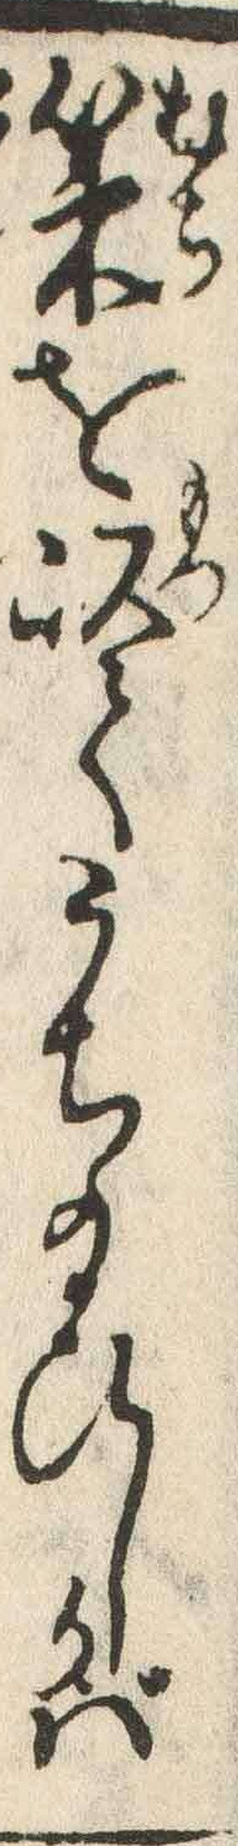策を以てうち給ひしかば
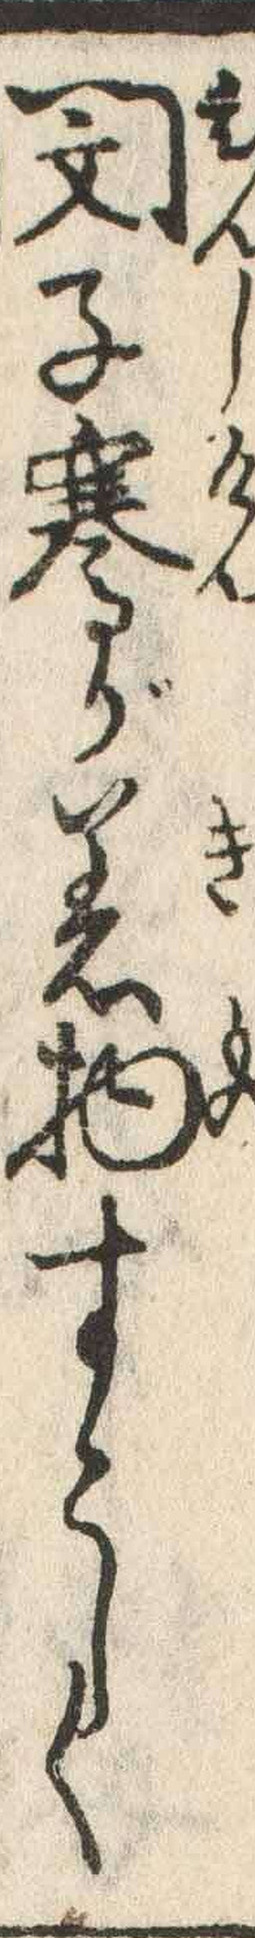閔子騫が着物すこしく
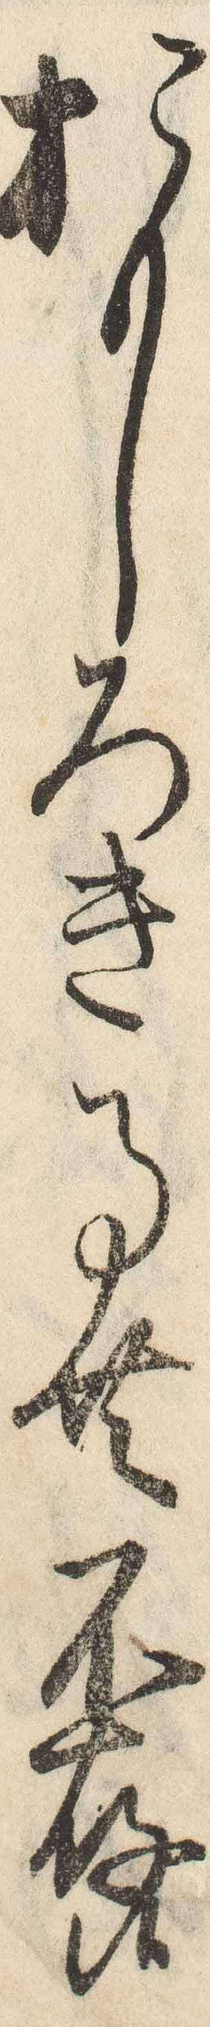おもしろき事共不存候
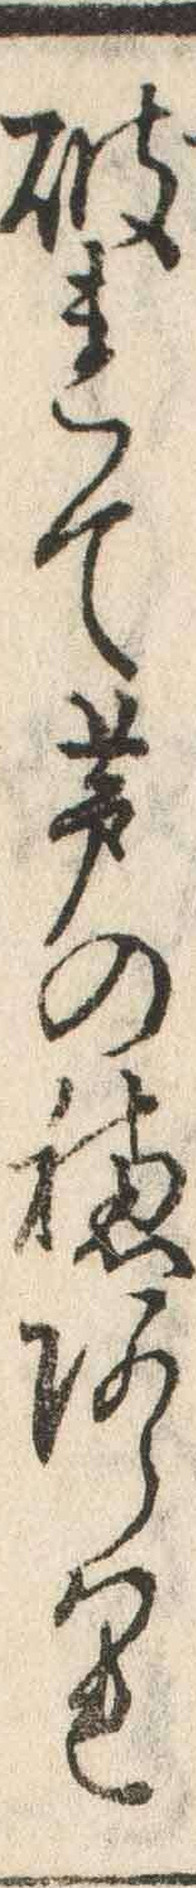破れて芦の穂あらはれ
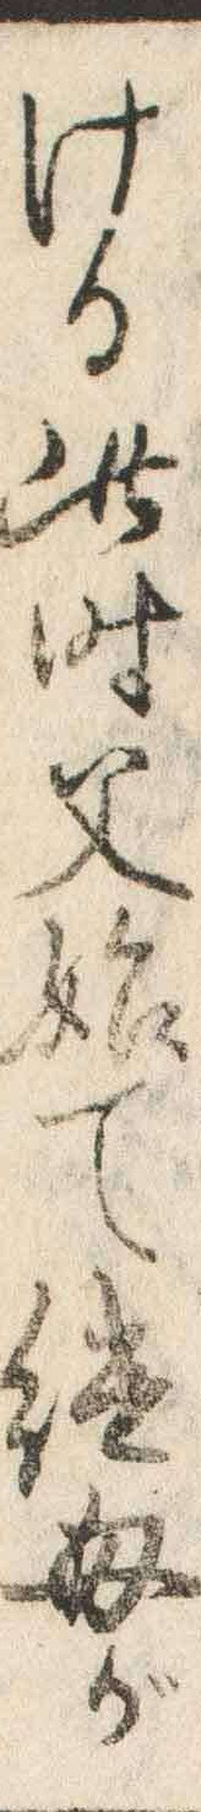ける此時父始て継母が
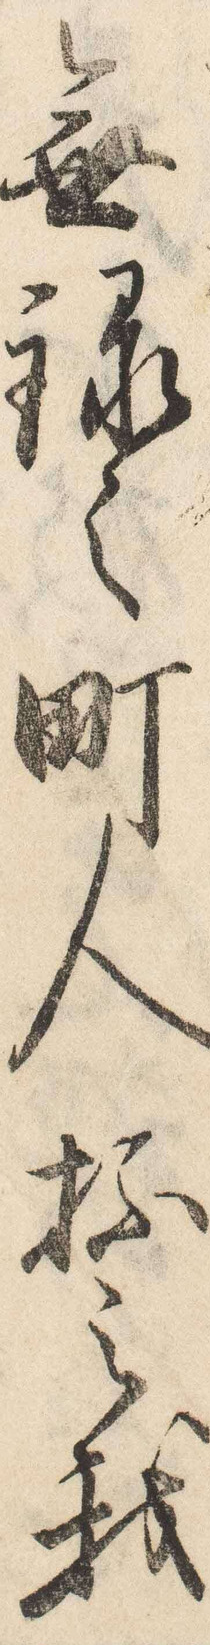無録之町人抔之我
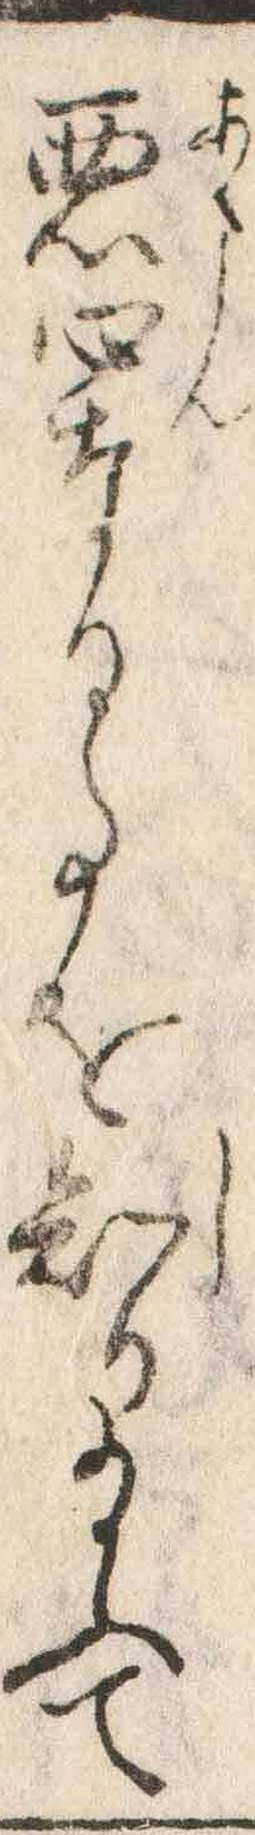悪心なる事を知り給ふて
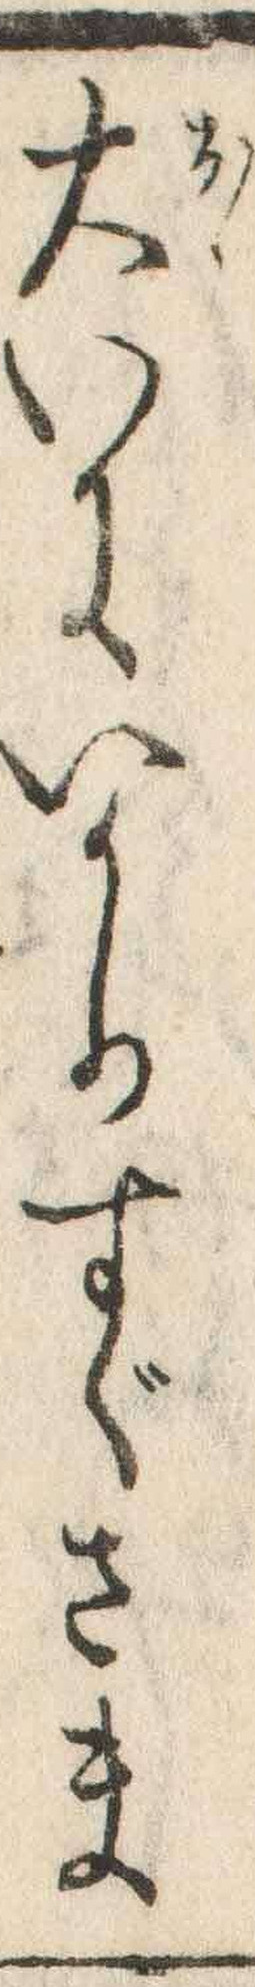大ににいかりすぐさま
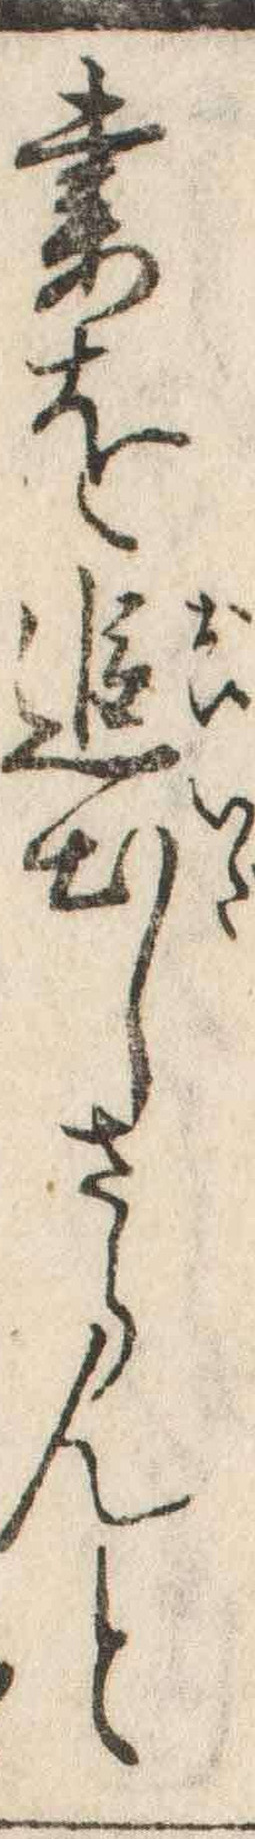妻を追出しさらんと
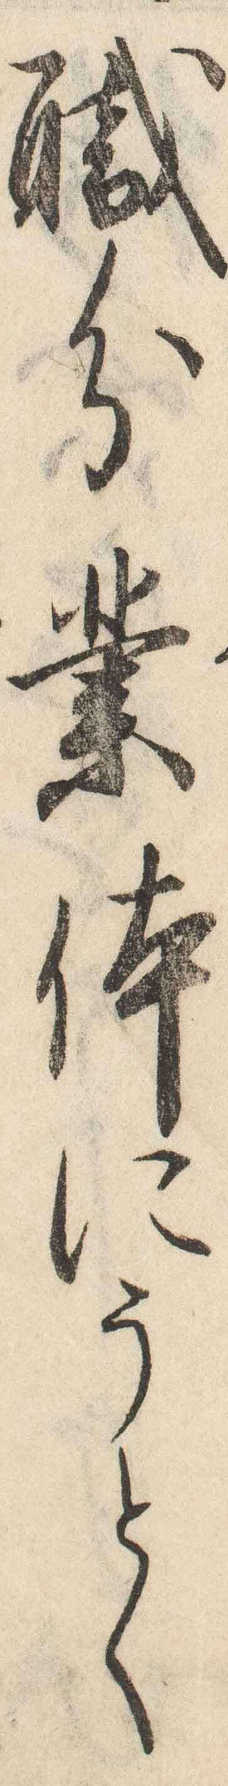職分業体にうとく
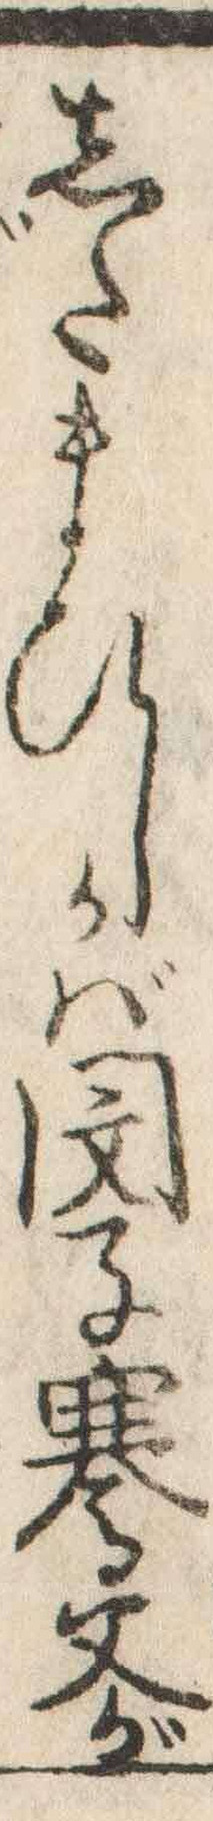したまひしかば閔子騫父が
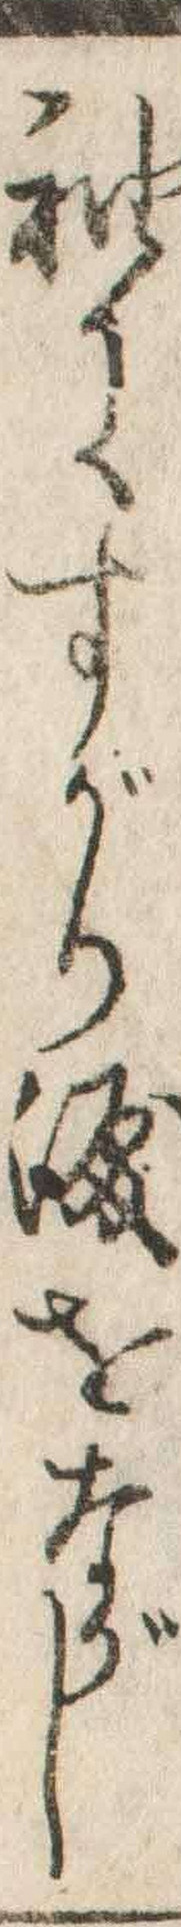袖にすがり涙をながし
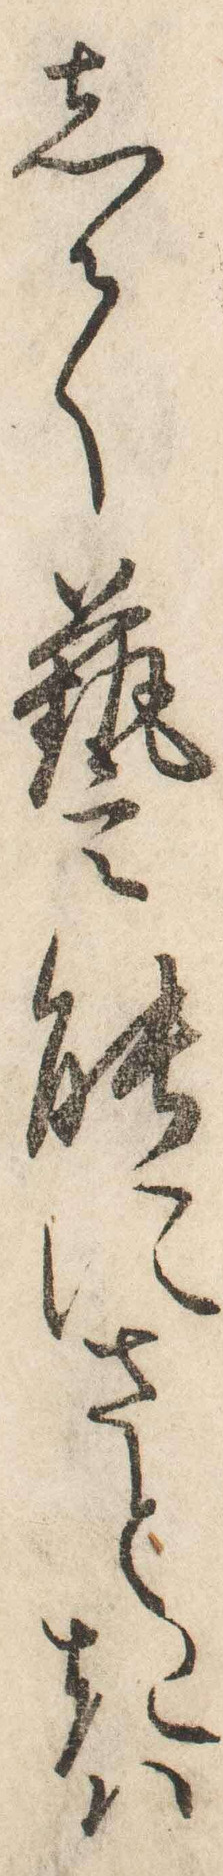して芸能にさときは
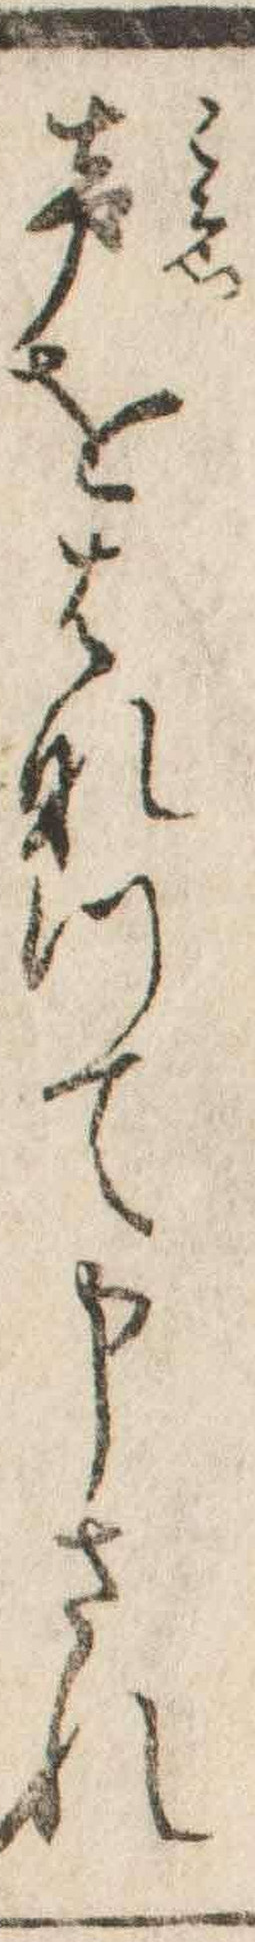声をはなつて申され
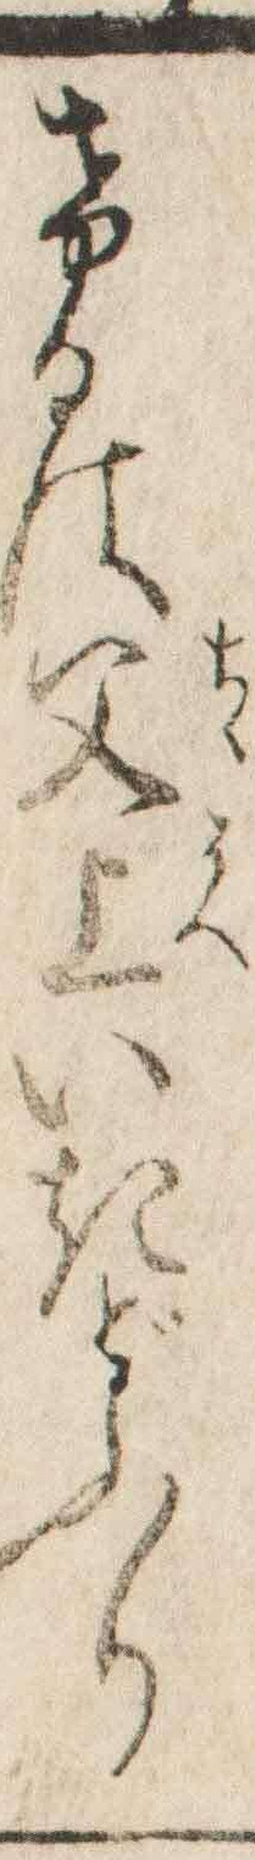けるは父上いきどふり
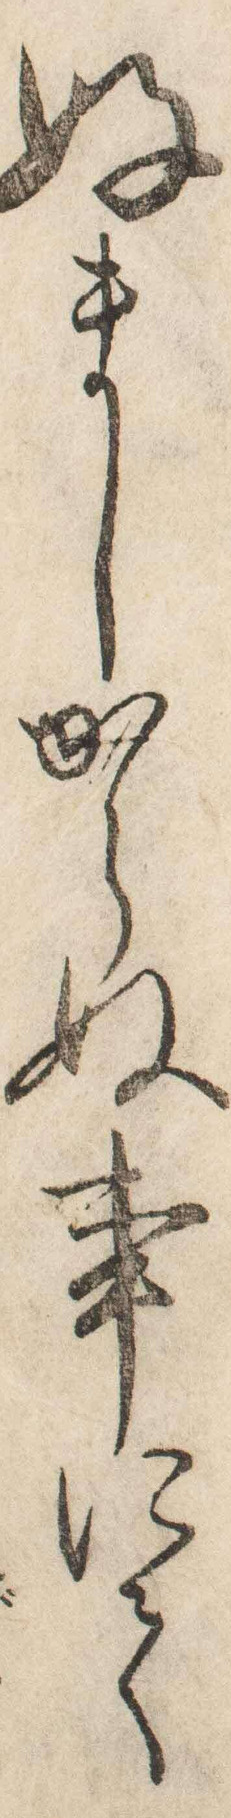好ましからぬ事にて
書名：撫育草
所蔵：東京学芸大学附属図書館 国文学研究資料館
